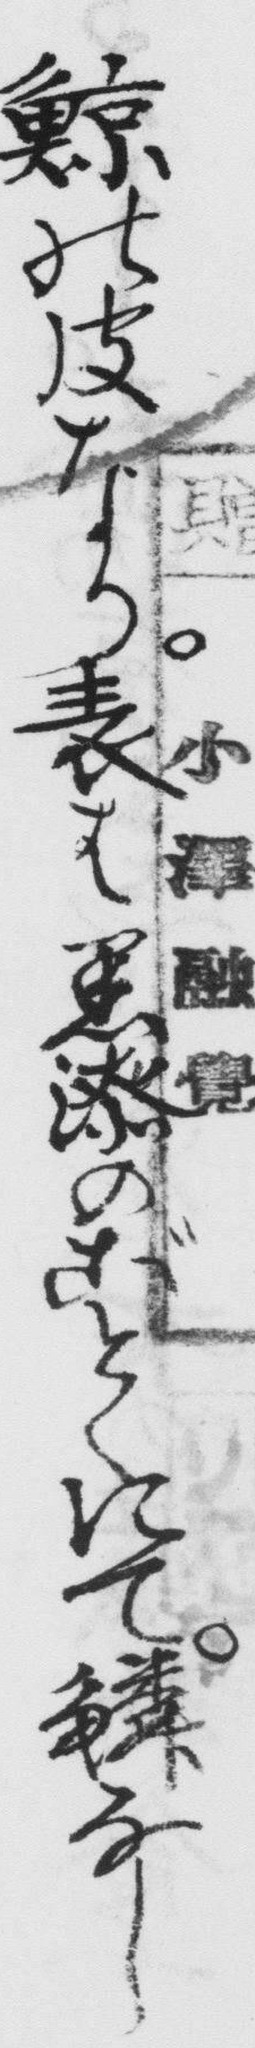黒皮鯨の皮なり。表は黒漆のごとくにて。鱗なし
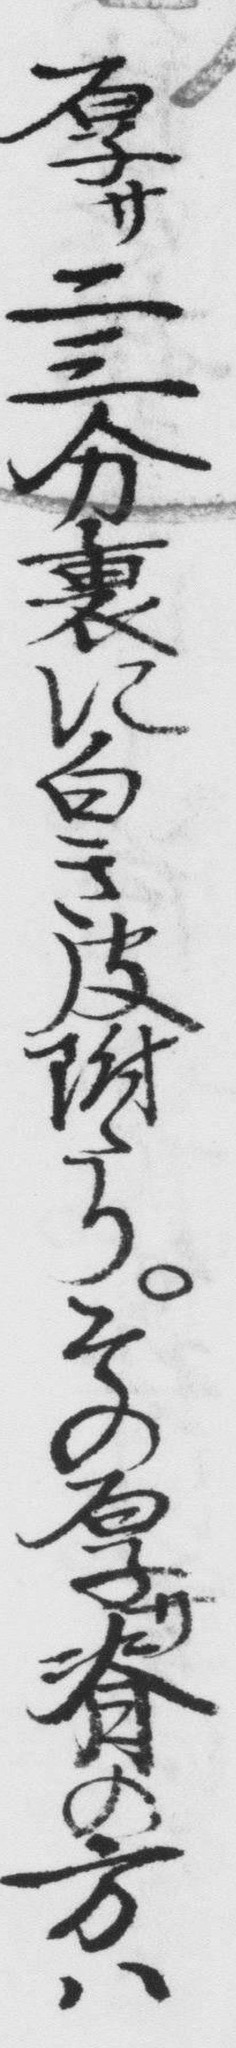厚サ二三分裏に白き皮附たり。その厚サ背の方は
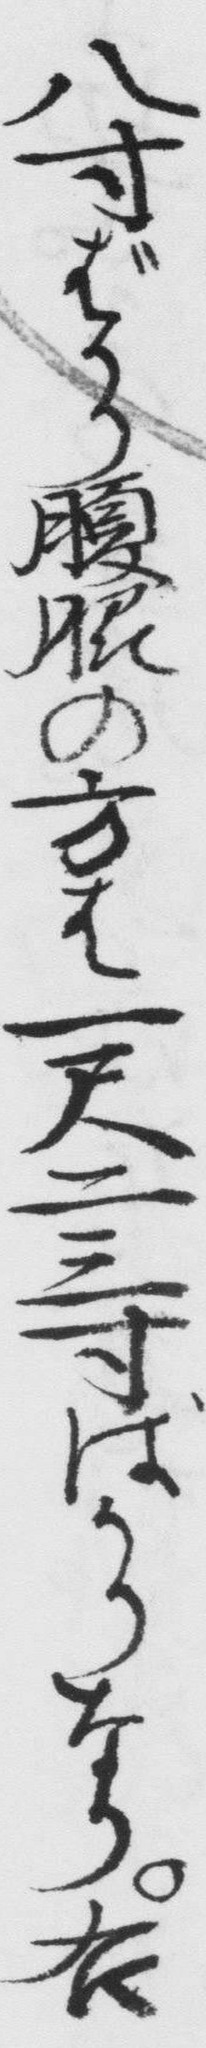八寸ばかり腹脇の方は一尺二三寸ばかりなり。右
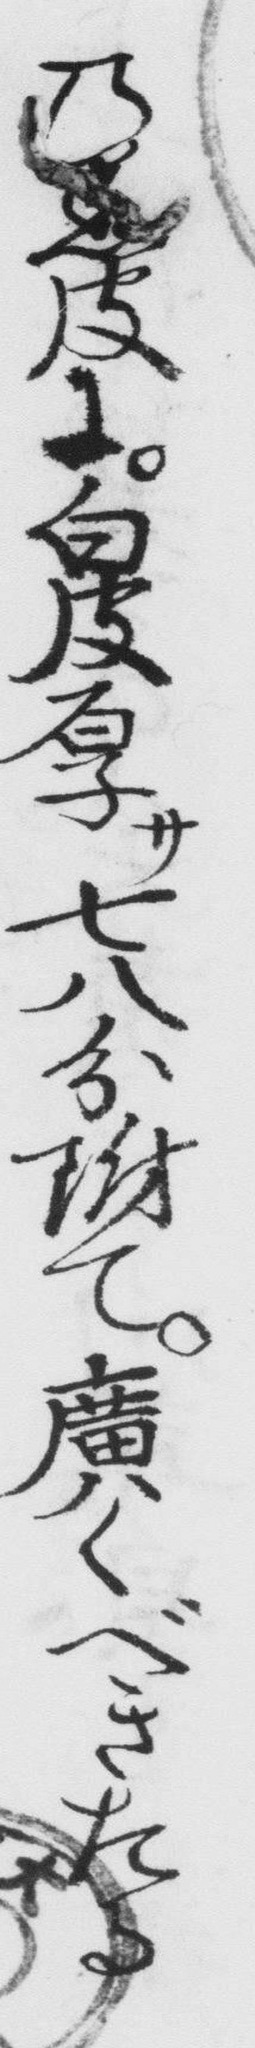の黒皮に。白皮厚サ七八分附て。広くべきたる
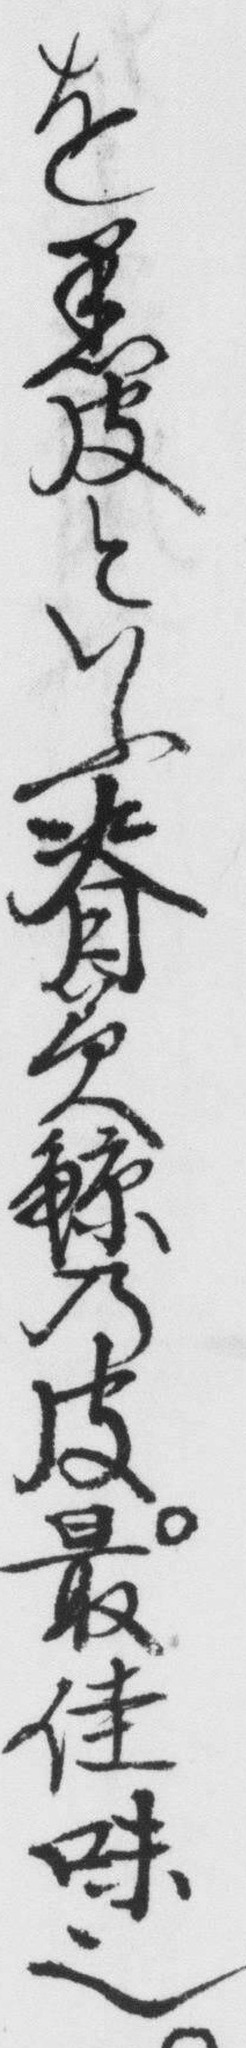を黒皮といふ背美鯨の皮。最佳味也。
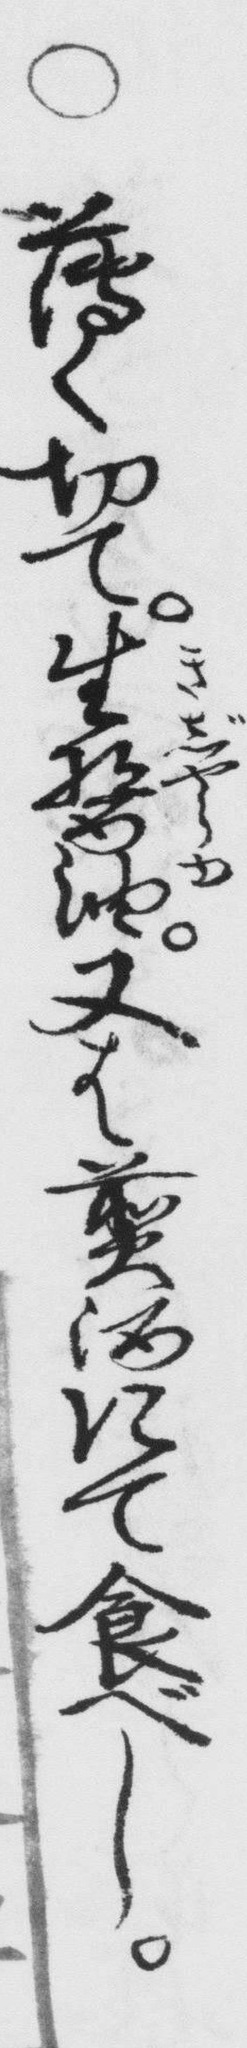○薄く切て。生醬油。又は煎酒にて食べし。
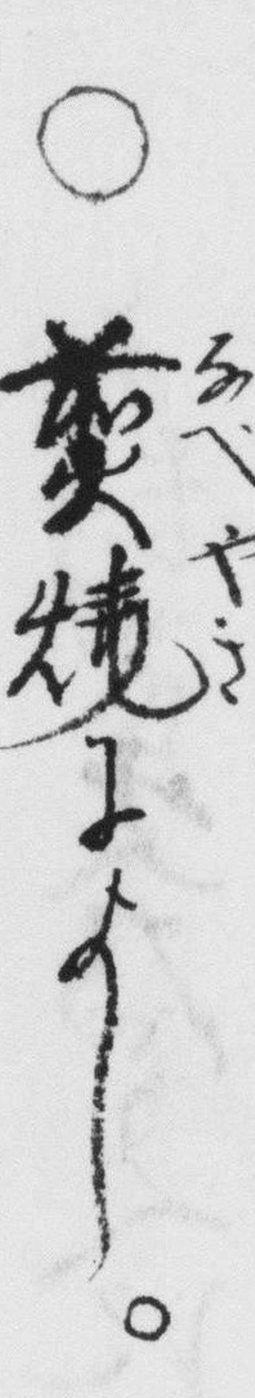○煎焼によし。
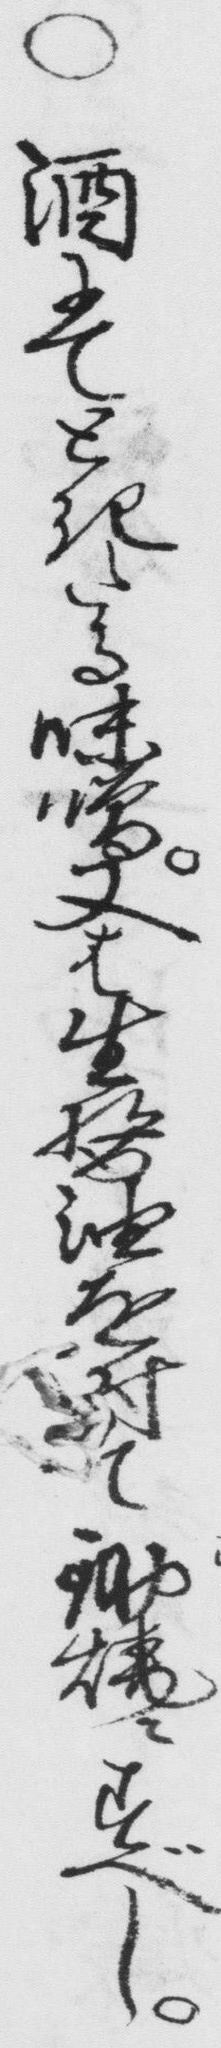○酒にてときたる味噌。又は生醤油を付て鋤焼にすべし。

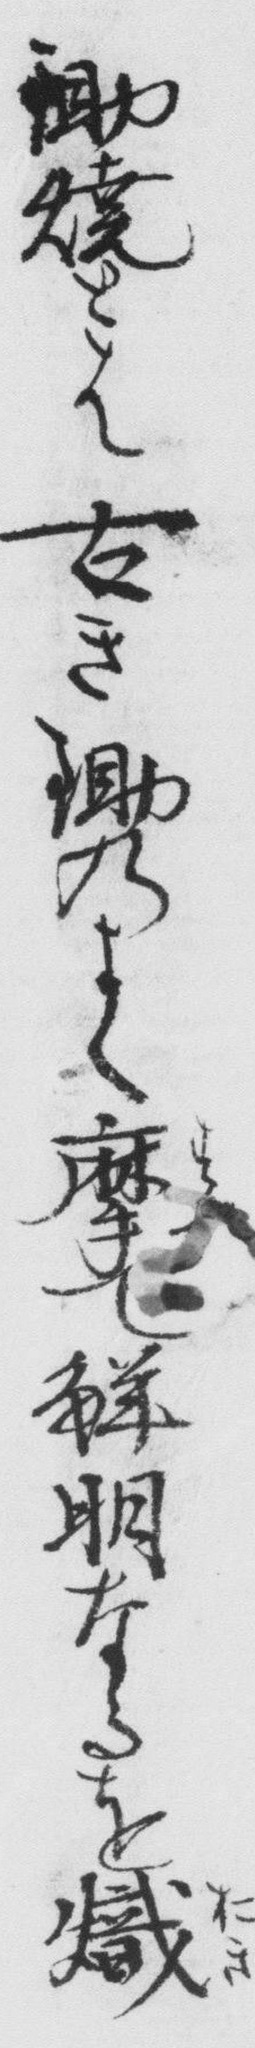鋤焼とは古き鋤の摩て鮮明なるを熾
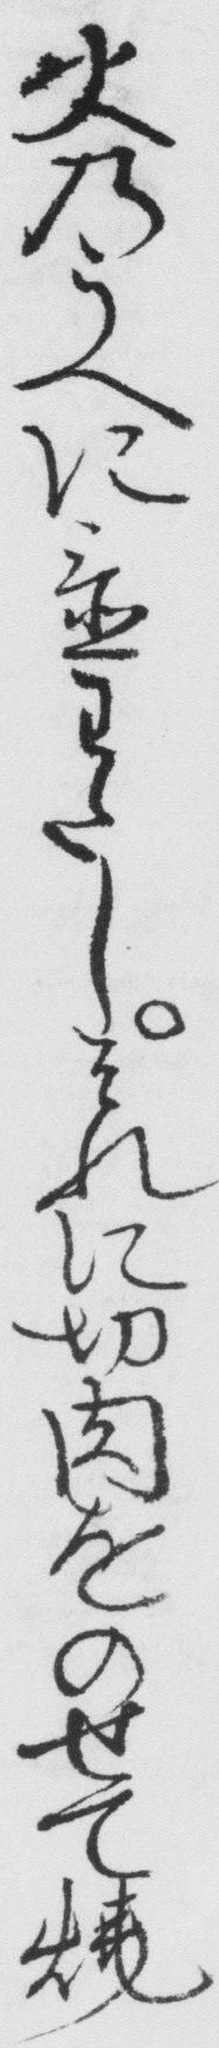火のうへに置わたし。それに切肉をのせて焼
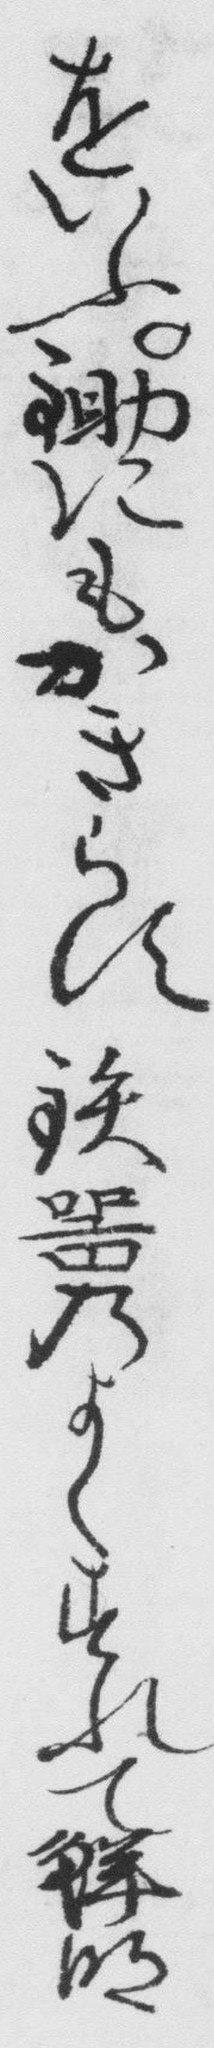をいふ。鋤にかきらす鉄器のよくすれて鮮明
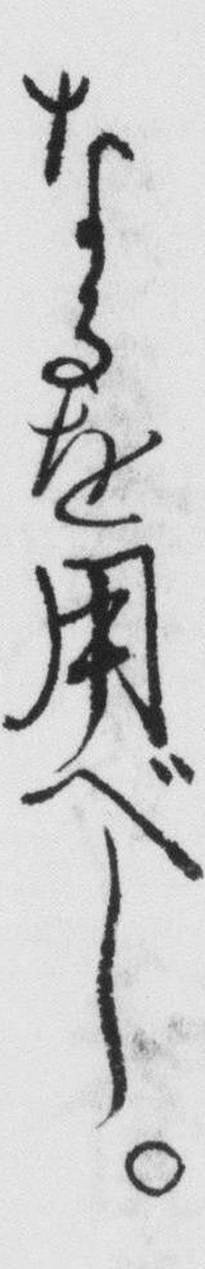なるを用べし。
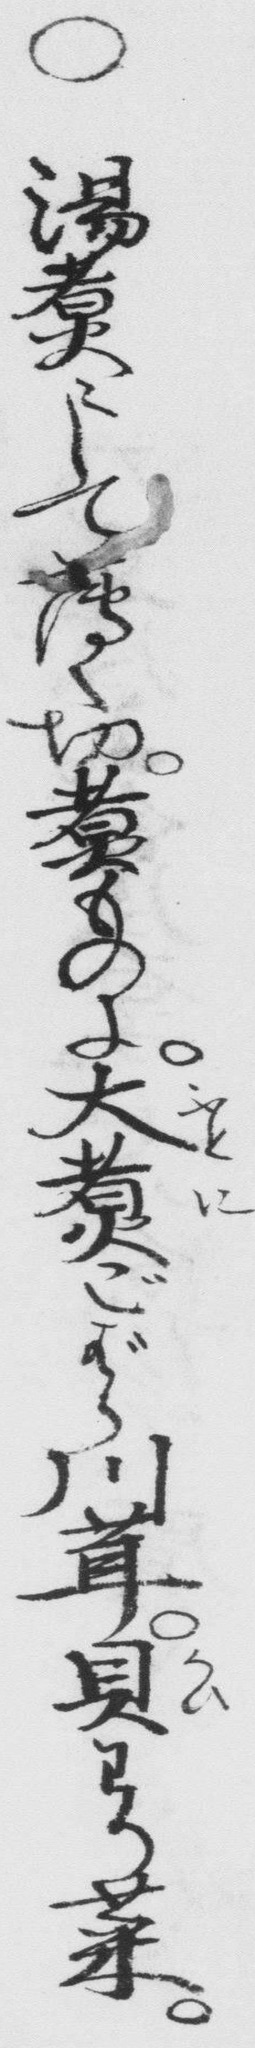○湯煮にして薄く切。煮ものに。太煮ごばう川茸。貝わり菜。
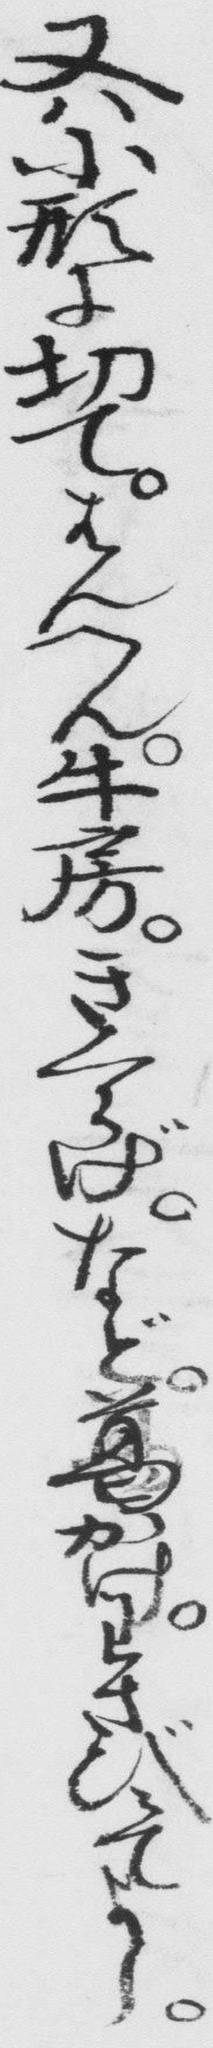又は小形に切て。はんへん。牛房。きくらげ。など。葛かけ。わさびにてよし。
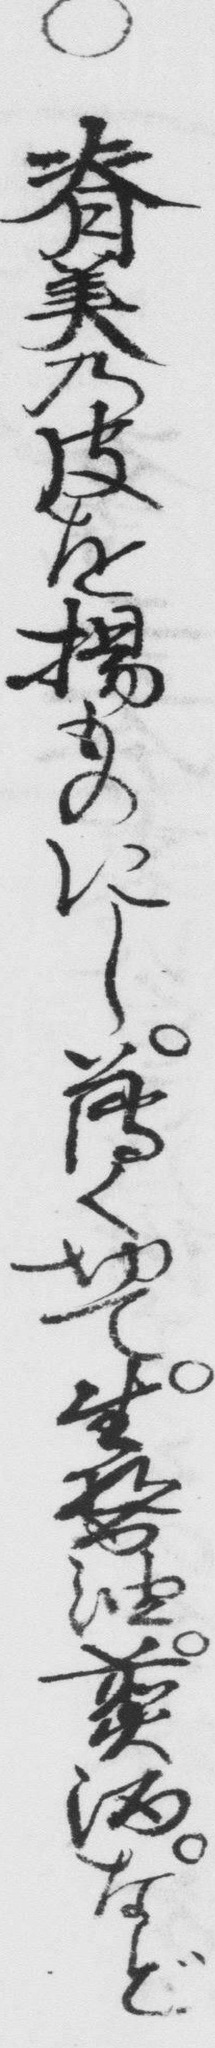○背美の皮を揚ものにし。薄く切て。生醤油。煎酒。など
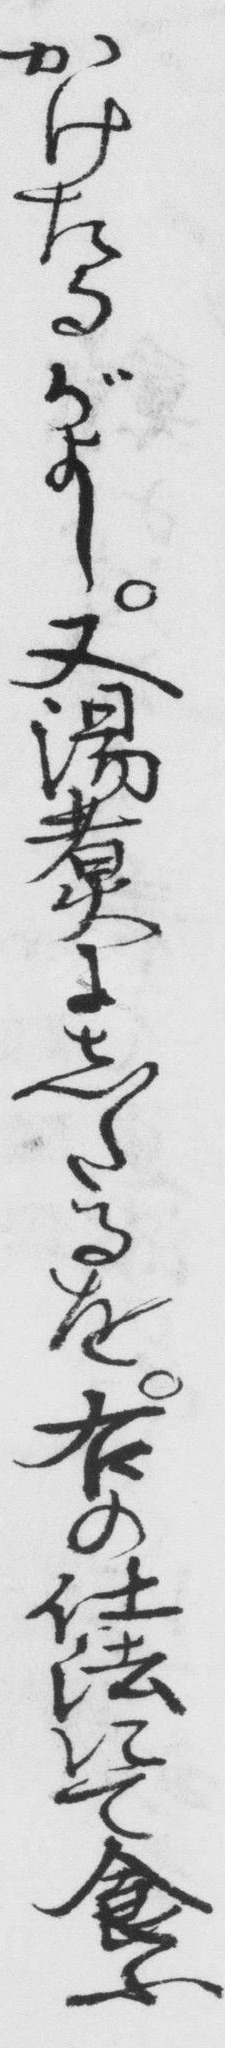かけたるがよし。又湯煮にしたるを。右の仕法にて食ふ
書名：鯨肉調味方
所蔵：大阪府立大学学術情報センター 国文学研究資料館
